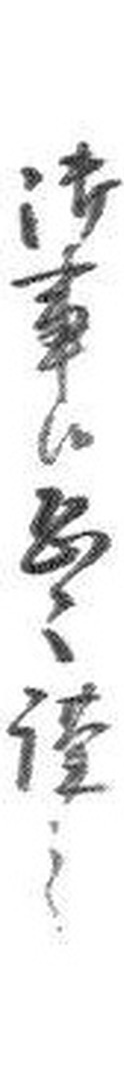御事候恐々謹言
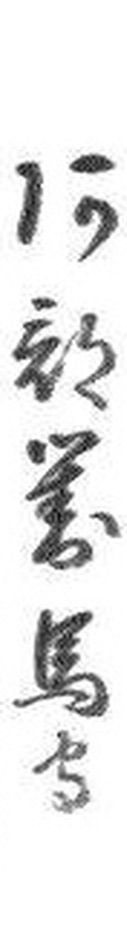阿部豊後守
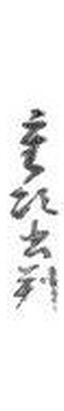重次書判
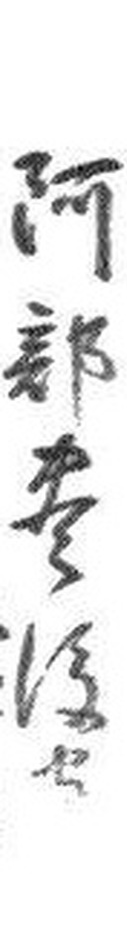阿部豊後守
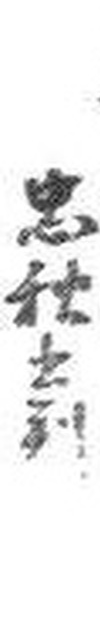忠秋書判

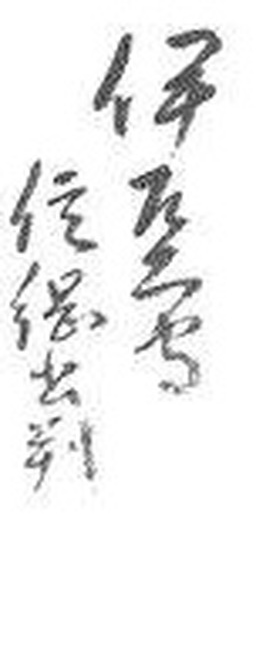信綱書判
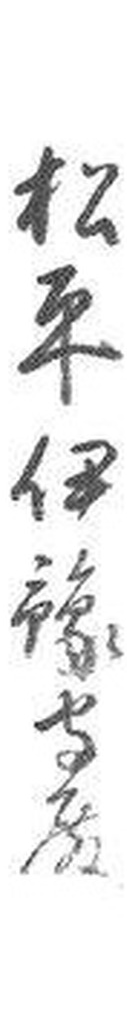松平伊豫守殿
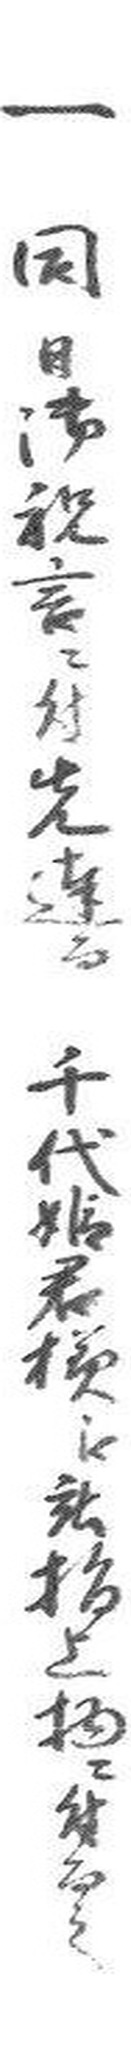一同日御祝言ニ付先達而千代姫君様江被指上物ニ付而之
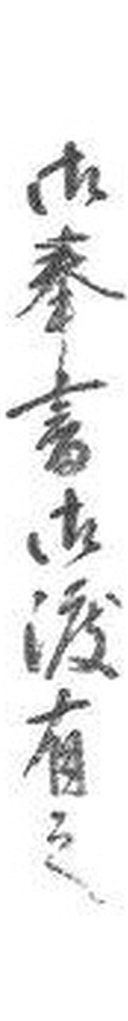御奉書御渡有之
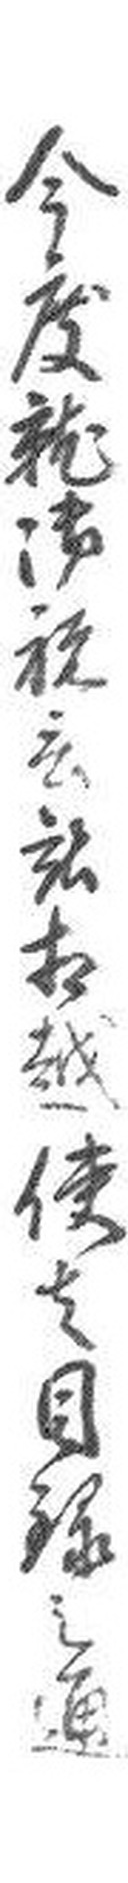今度就祝言被相越使者目録之通
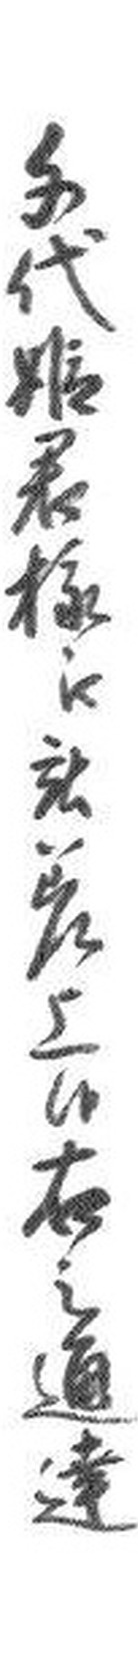千代姫君様江被差上候右之通達
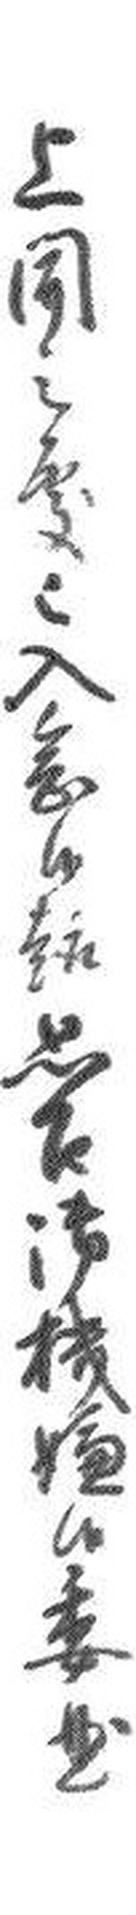上聞之処被入念候趣思召御機嫌候委曲
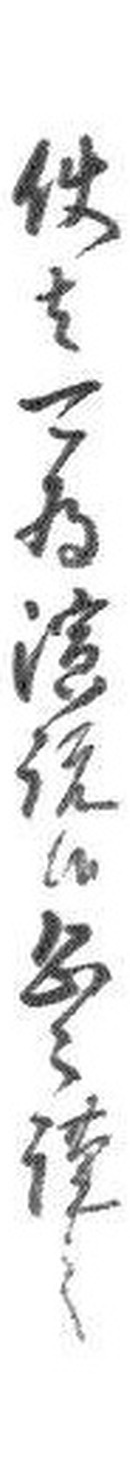使者可為演説候恐々謹言
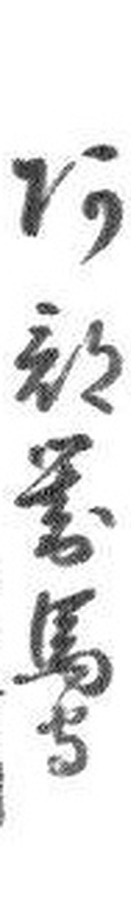阿部豊後守
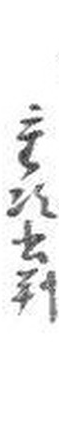重次書判
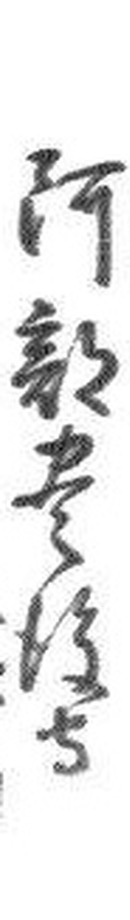阿部豊後守
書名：家譜 四 忠昌公 従寛永七年到正保四年
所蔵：福井県文書館 Fukui Prefectural Archives
